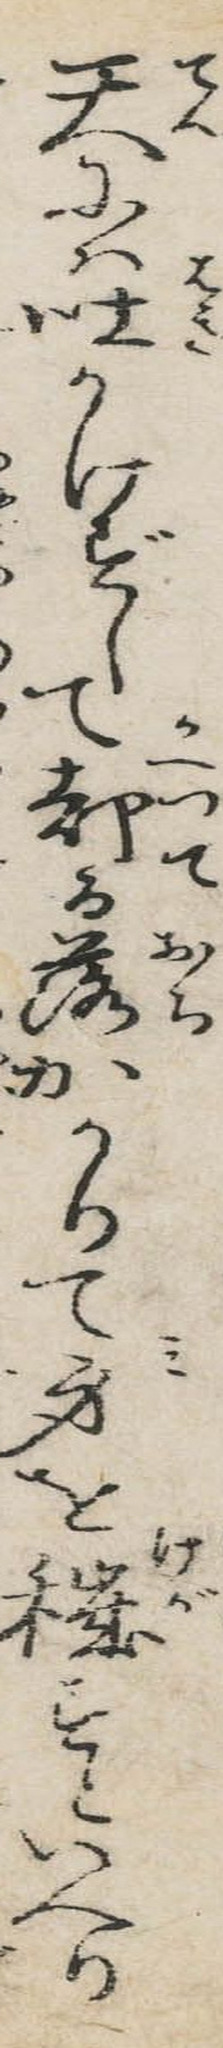天には吐かけずして却而落かかりて身を穢すといへり
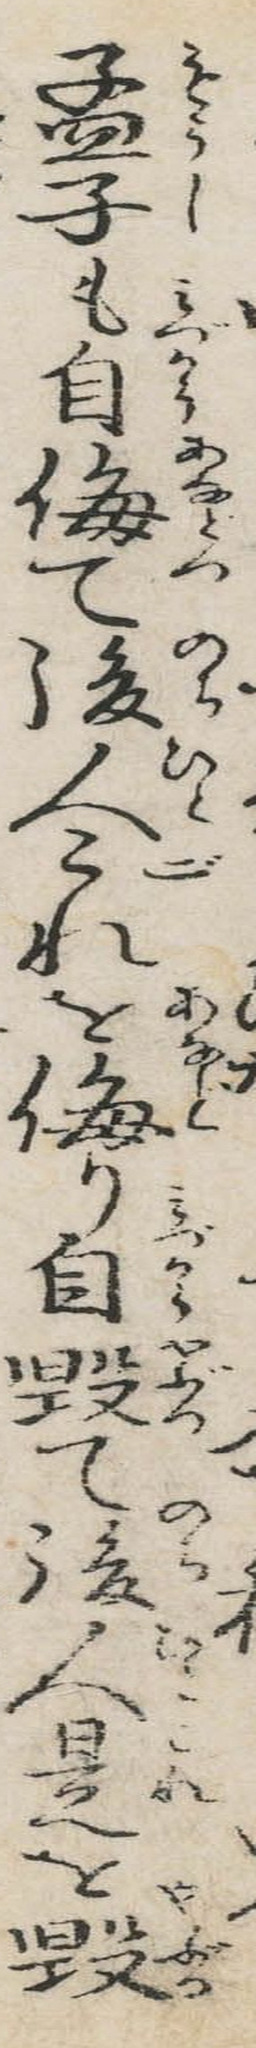孟子も自侮て後人これを侮り自毀て後人是を毀
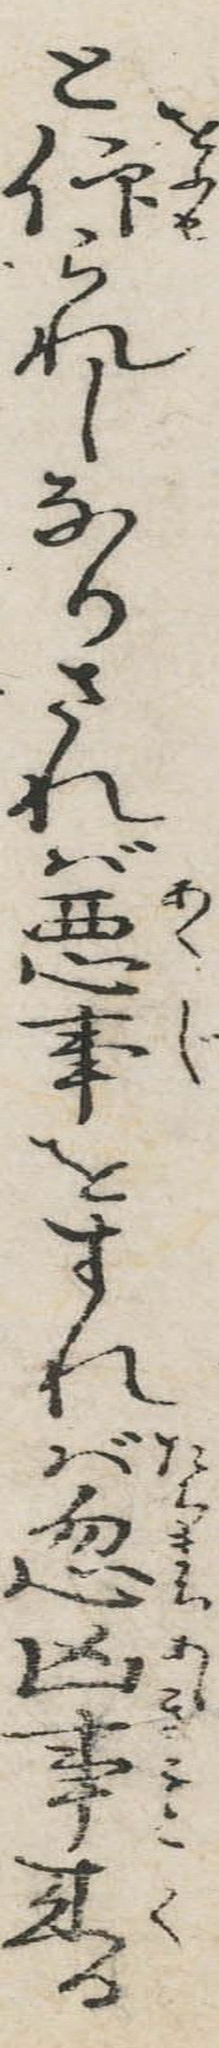と仰られしなりされば悪事をすれば忽凶事来る
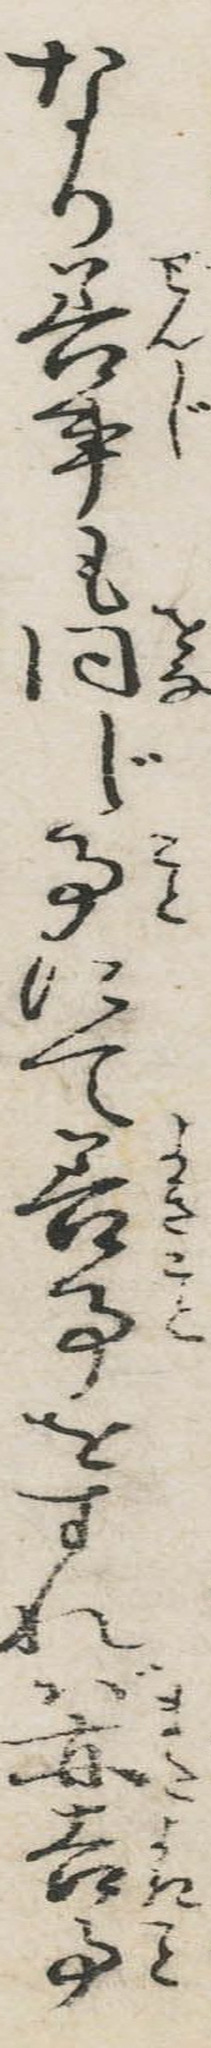なり善事も同じ事にて善事をすれば亦吉事
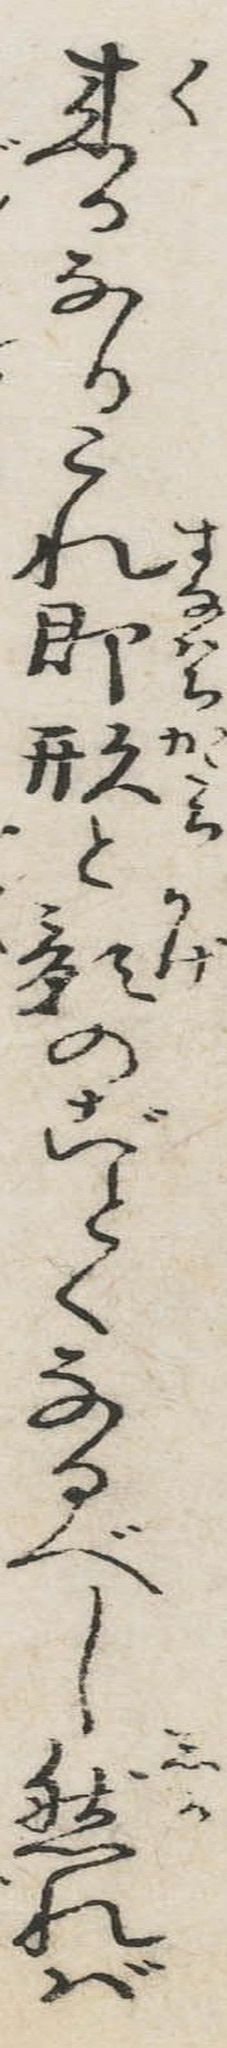来るなりこれ即形と影のごとくなるべし然れば
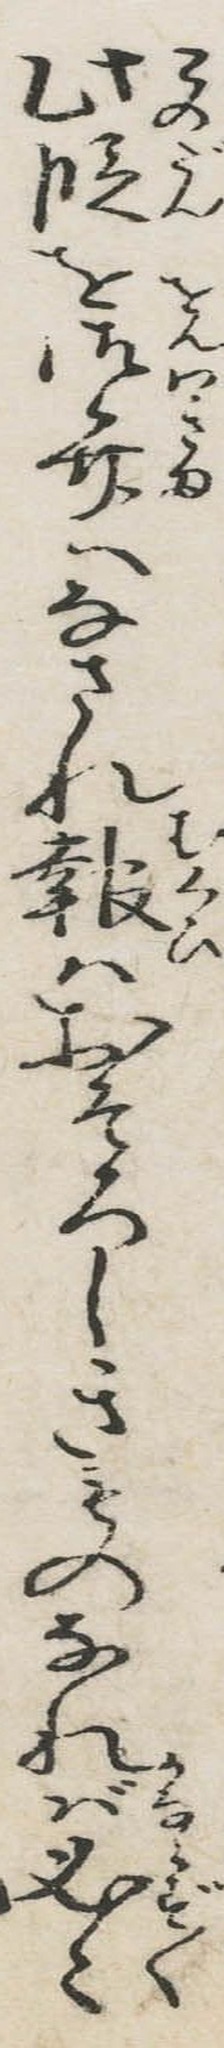此段を御弁へなされ報はおそろしきものなれば必々
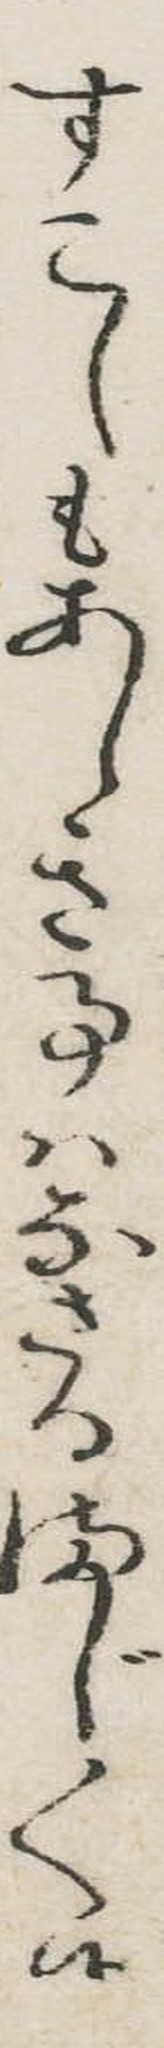すこしもあらき事はなさるまじく候
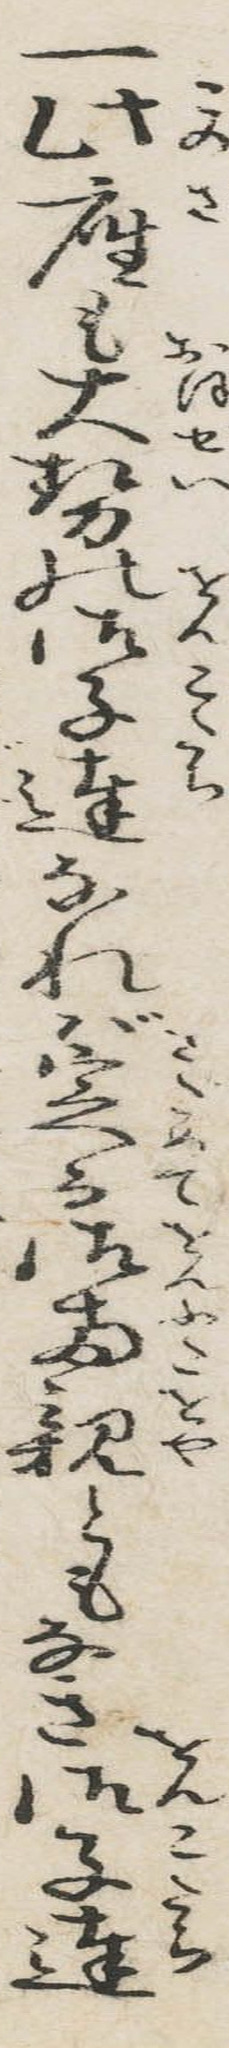一此座も大勢の御子達なれば定而御両親ともなき御子達
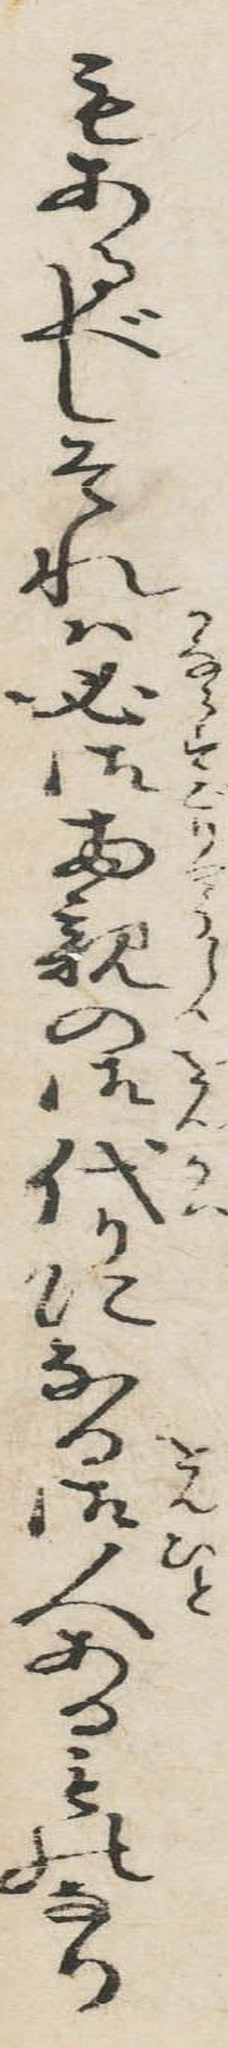もあるべしそれは必御両親の御代りになる御人あるものなり
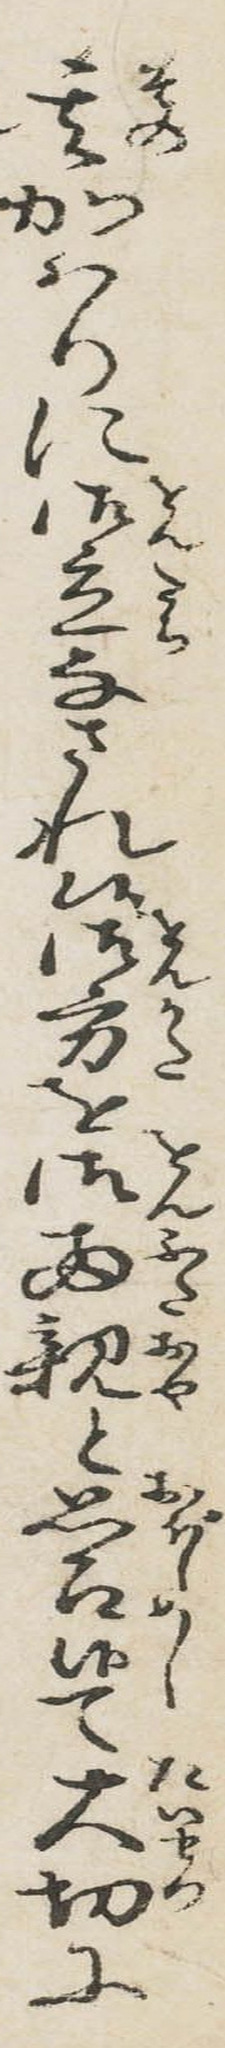其かはりに御立なされ候御方を御両親と思召候て大切に
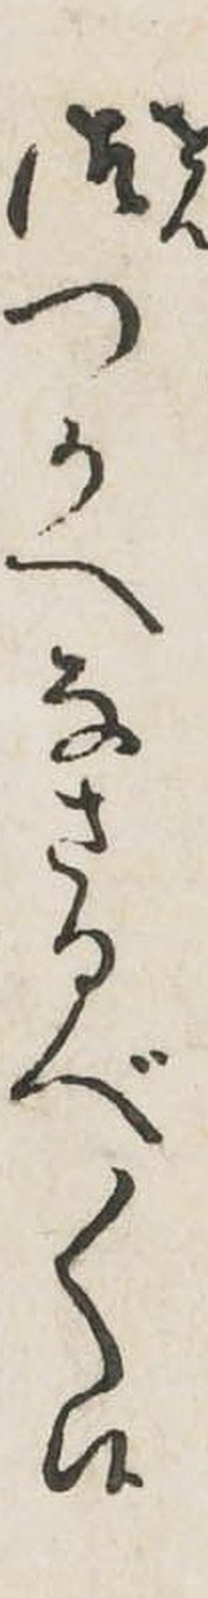御つかへなさるべく候
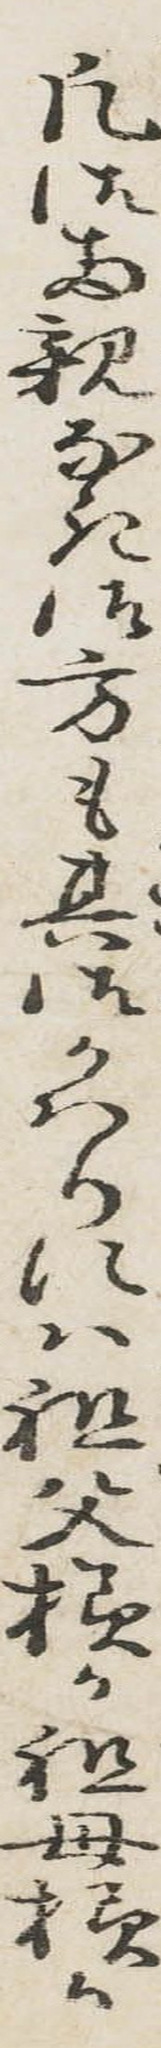凡御両親なき御方も其御かはりには祖父様か祖母様か
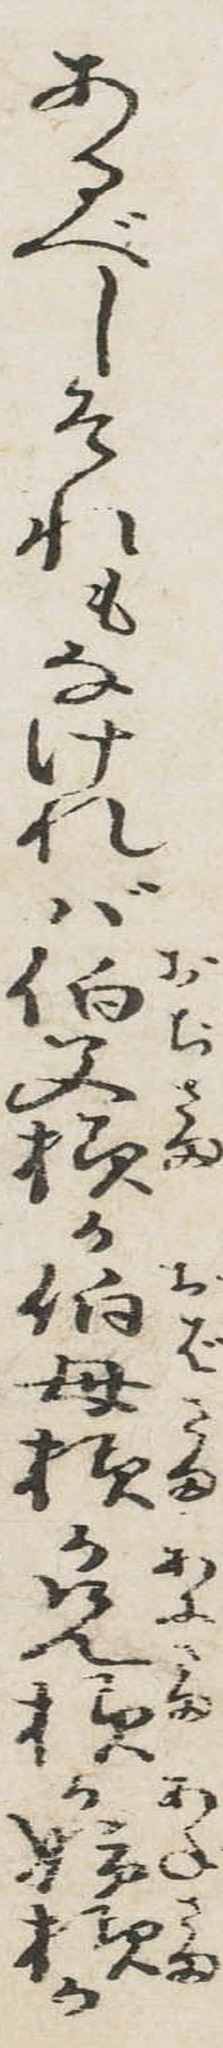あるべしそれもなければ伯父様か伯母様か兄様か姉様か
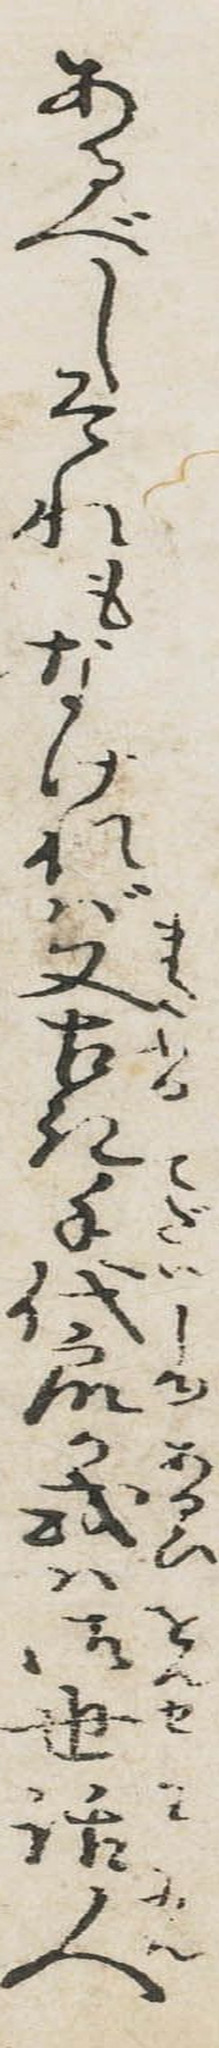あるべしそれもなければ又古き手代衆か或は御世話人
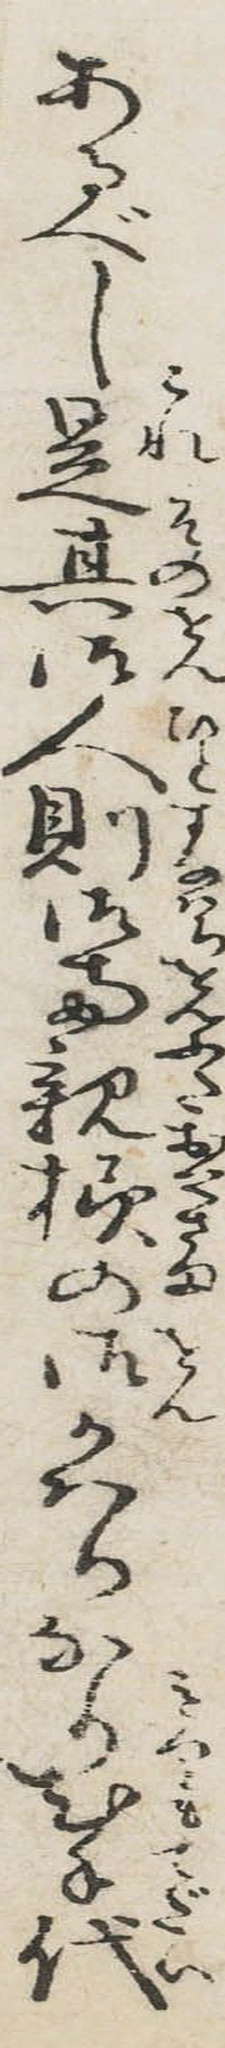あるべし是其御人則御両親様の御かはりなり尤手代
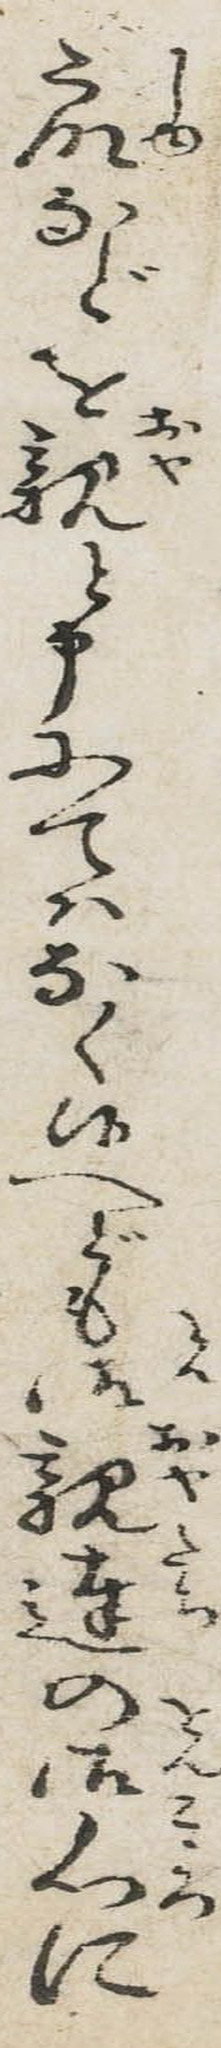衆などを親と申すにてはなくそう候へども御親達の御心に
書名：前訓
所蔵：東京学芸大学附属図書館
